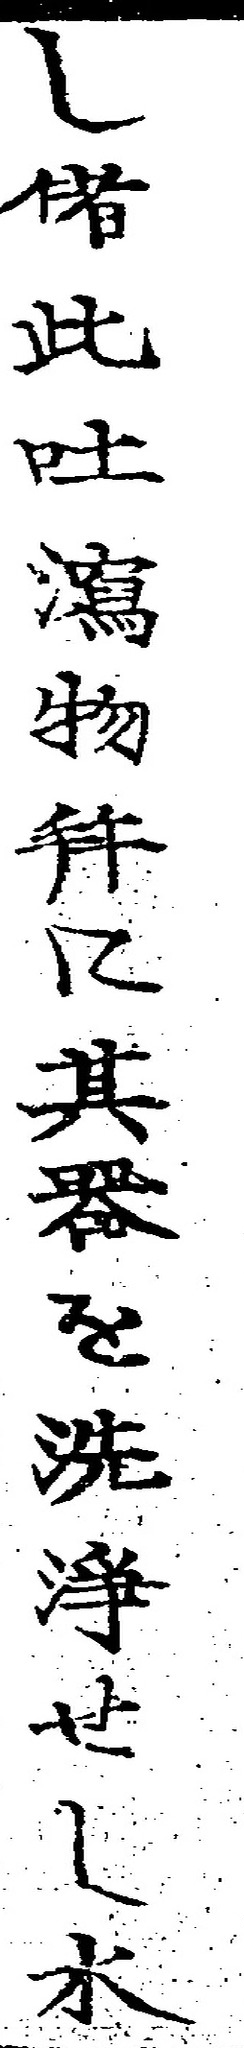し偖此吐瀉物幷に其器を洗浄せし水
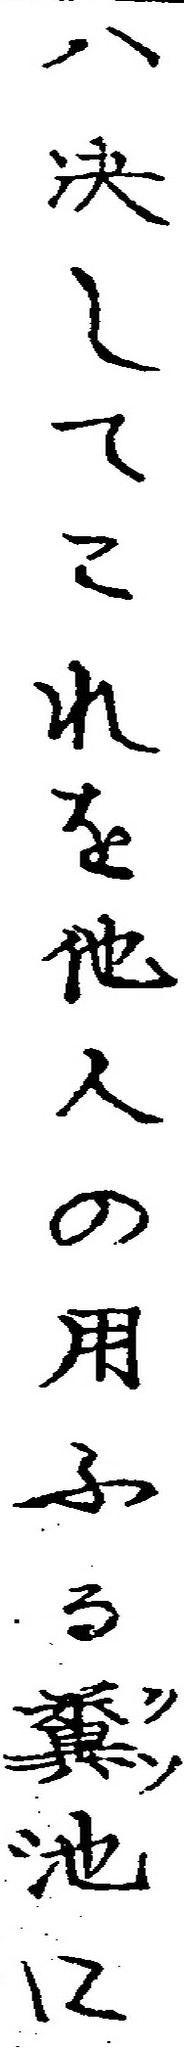は決してこれを他人の用ふる糞池に
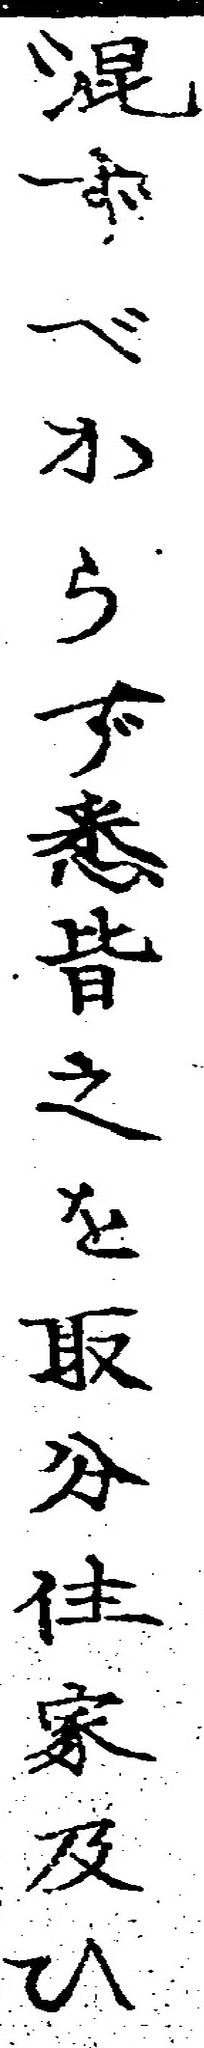混ずべからず悉皆之を取分住家及び
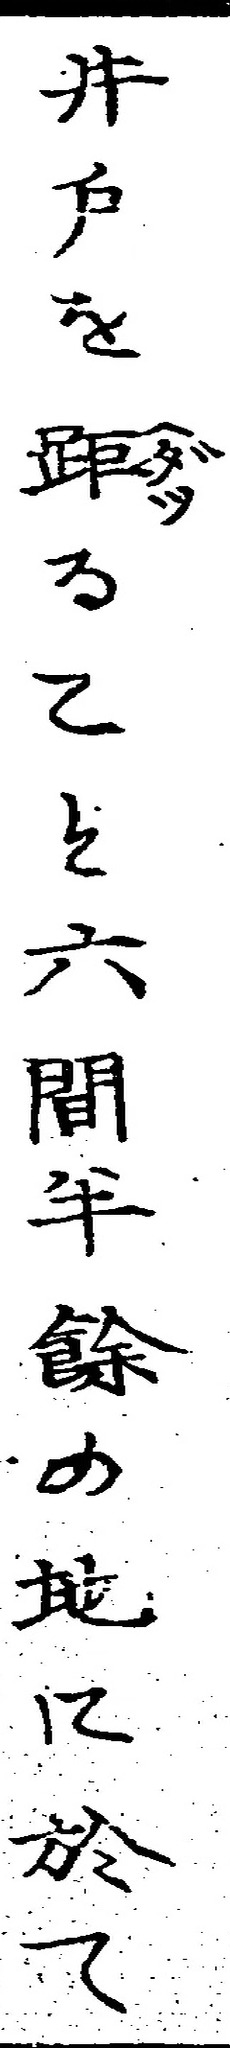井戸を距ること六間半餘の地に於て
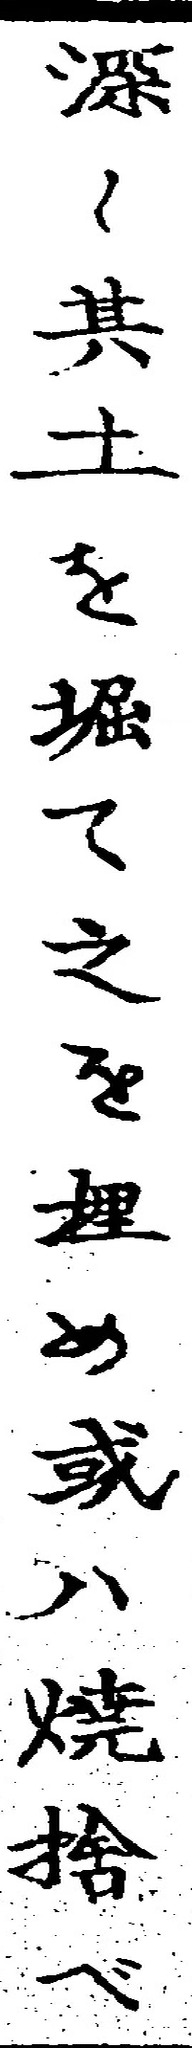深く其土を掘て之を埋め或は焼捨べ
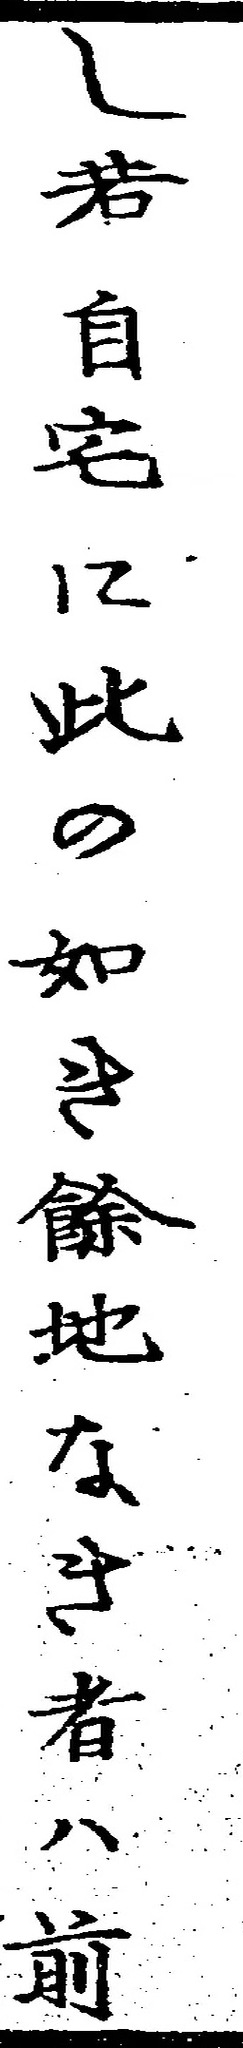し若自宅に此の如き餘地なき者は前
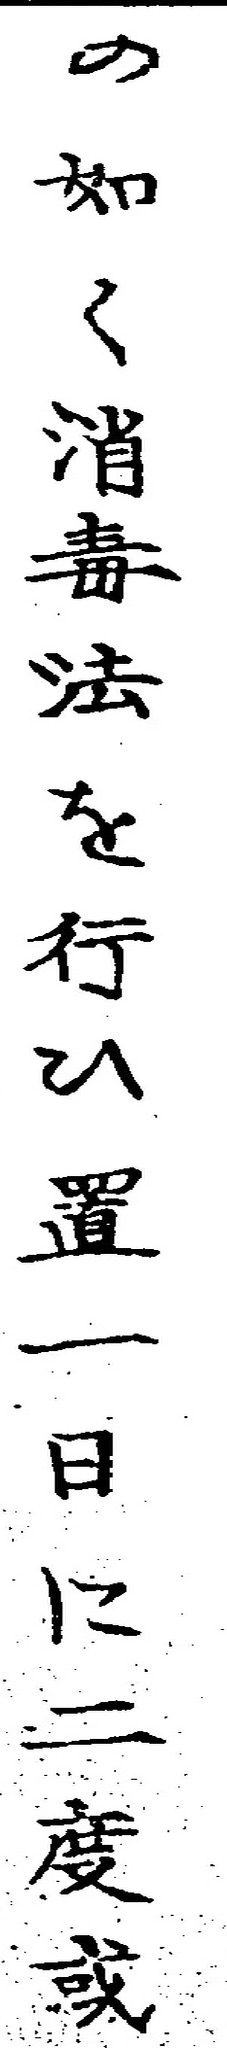の如く消毒法を行ひ置一日に二度或
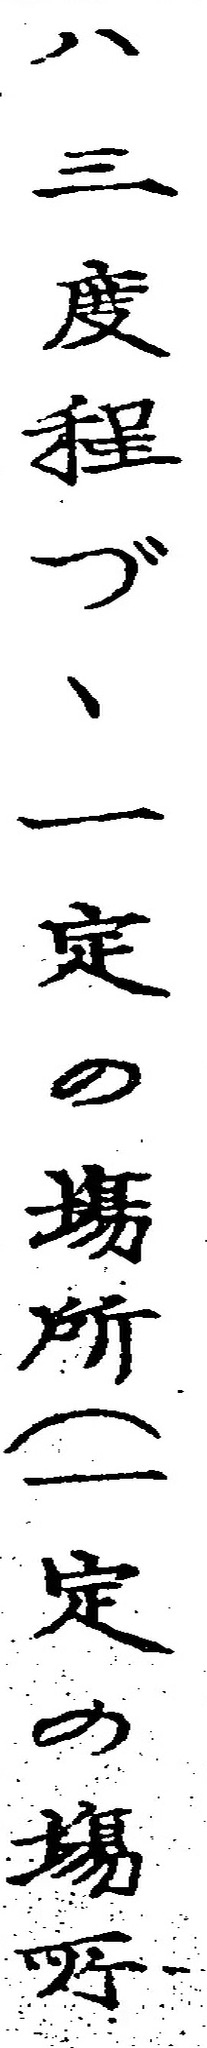は三度程づゝ一定の場所[一定の場所
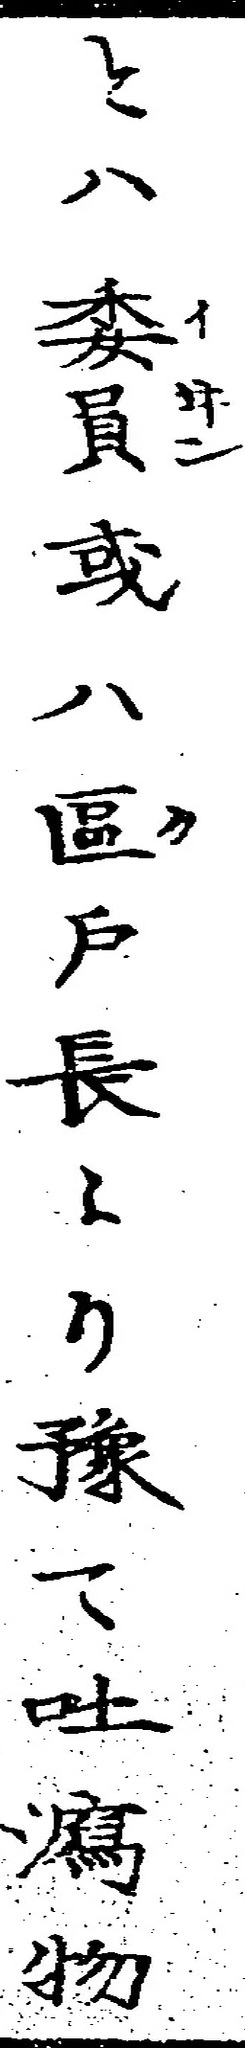とは委員或は區戸長より豫て吐瀉物

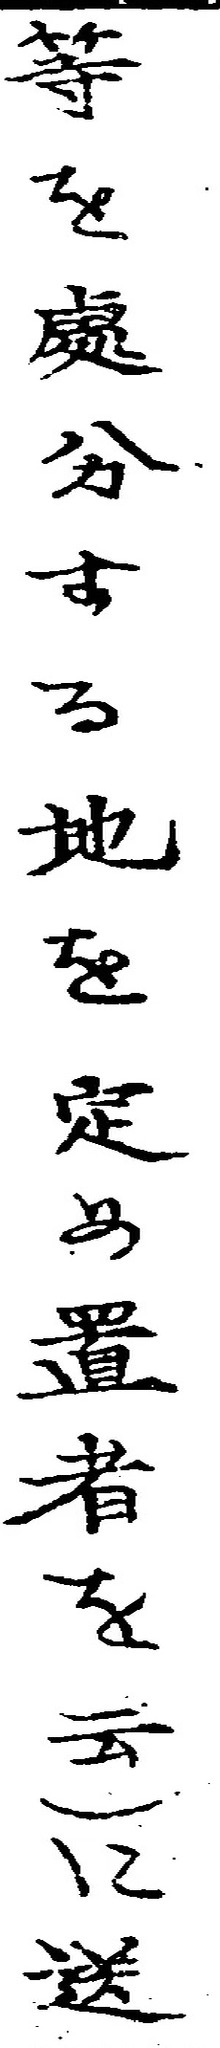等を處分する地を定め置者を云]に送
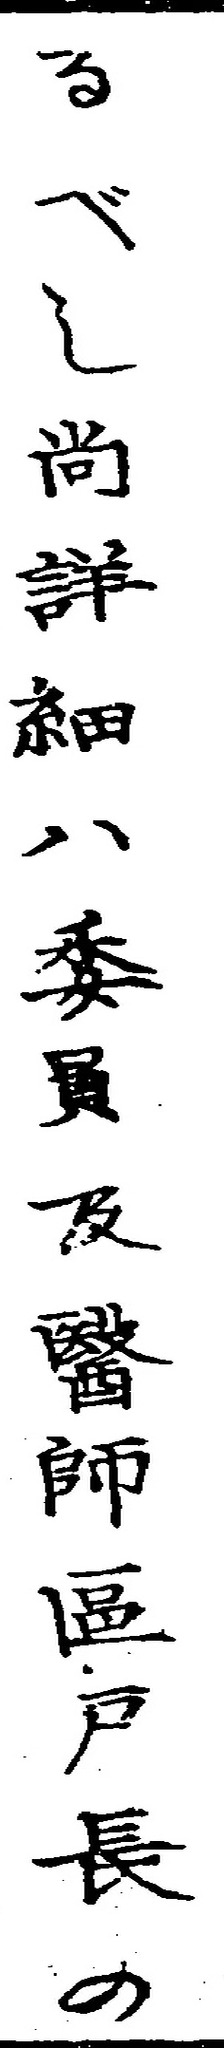るべし尚詳細は委員及醫師區戸長の
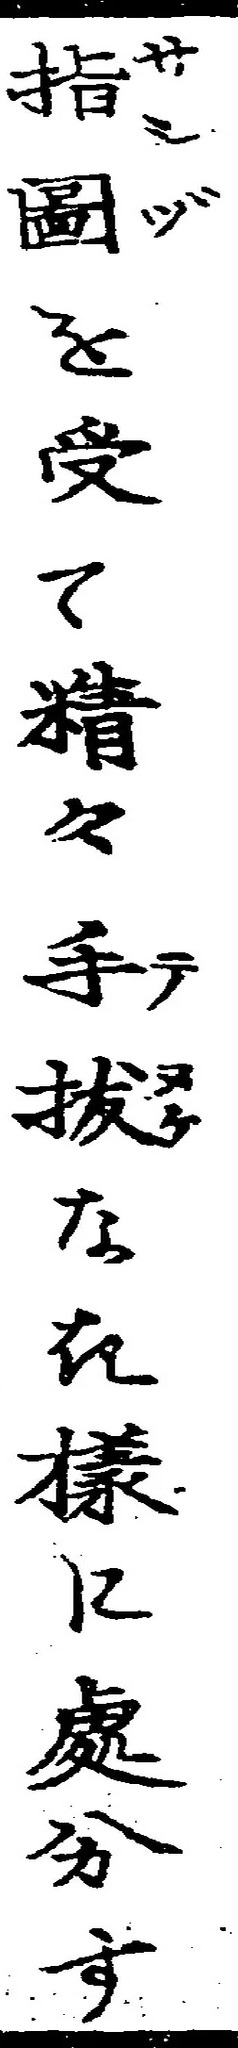指圖を受け精々手抜な花様に處分す
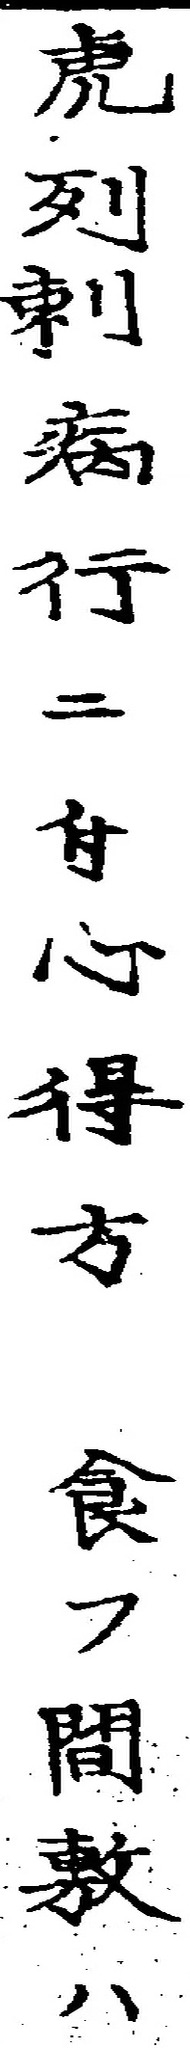虎列刺病行に付心得方食ふ間敷は

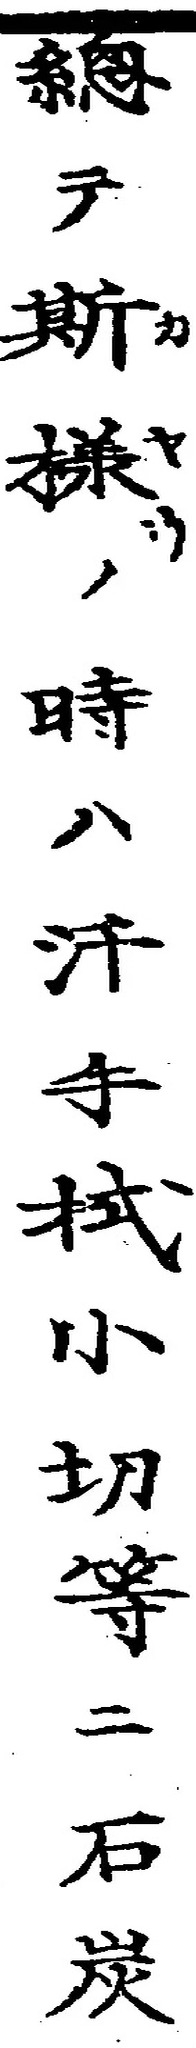總て斯様の時は汗手拭小切等に石炭
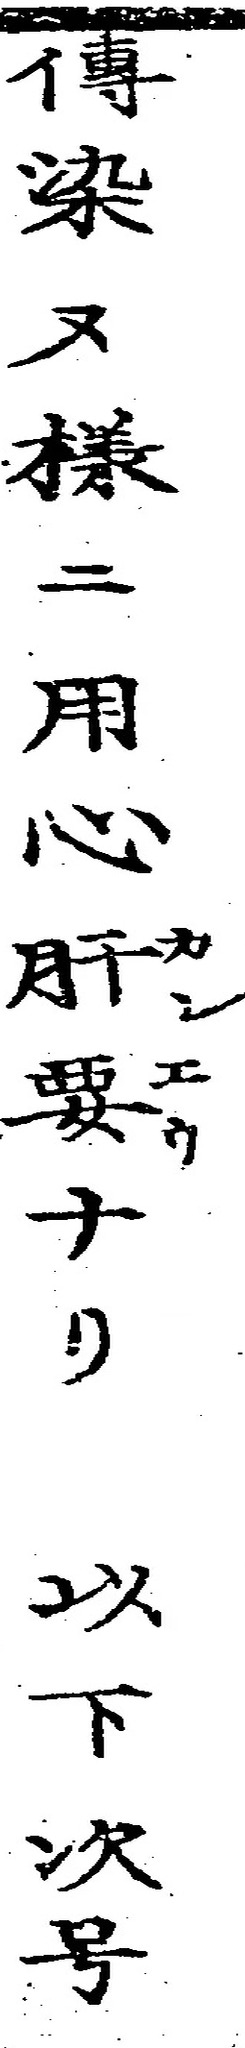傅染〆様に用心肝要なり以下次号

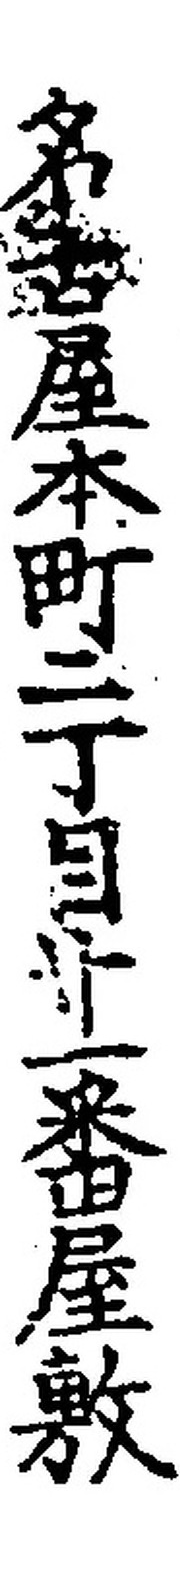名古屋本町二丁目廿一番屋敷
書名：虎列剌病予防用法
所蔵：国立国会図書館 National Diet Library, JAPAN
